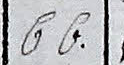66.
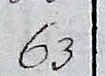63
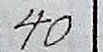40
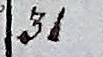31
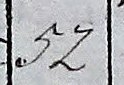52
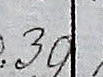39
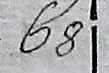68
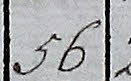56
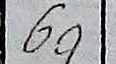69
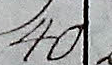40
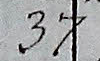37
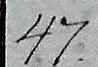47
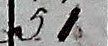51
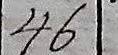46
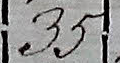35
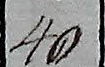40
